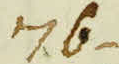76
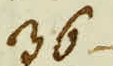36
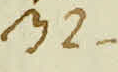32
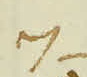7
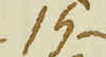15
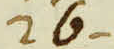26
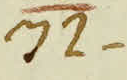32
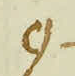9
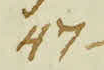47
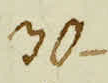30
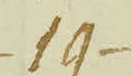19
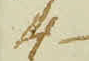4
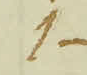1
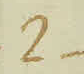2
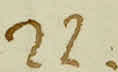22
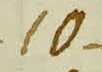10
